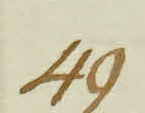49
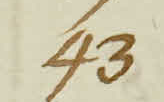43
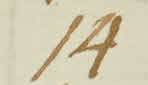14
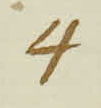4
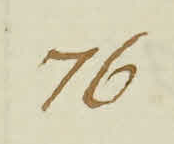76
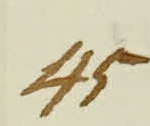45
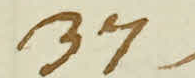37
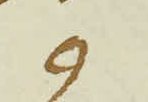9
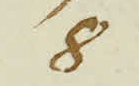8
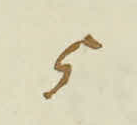5
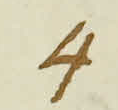4
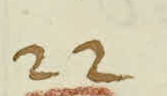22
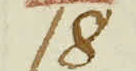18
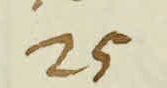25
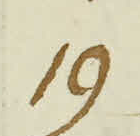19
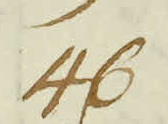46
